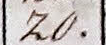20.
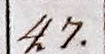47.
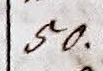50.
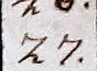27.
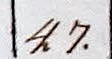47.
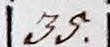35.
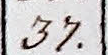37.
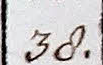38.
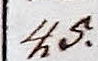45.
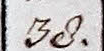38.
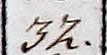32.
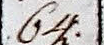64.
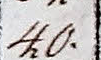40.
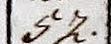52.
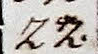22.
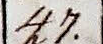47.
